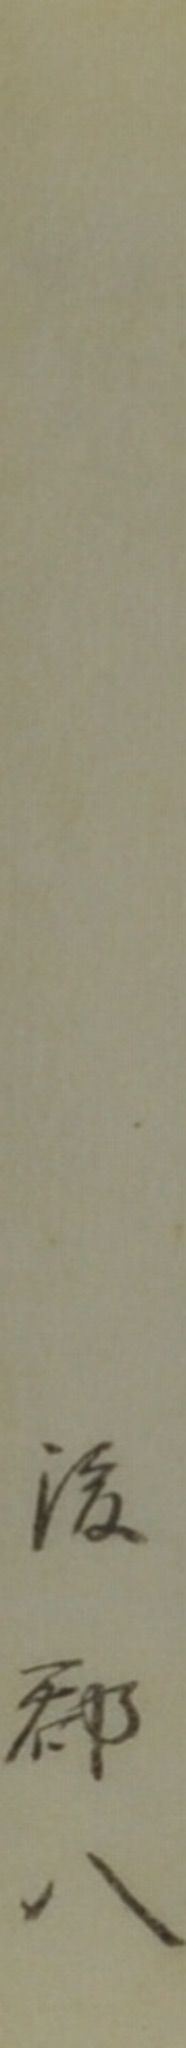後郡八
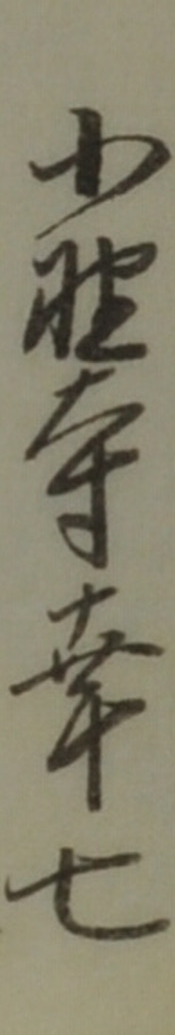小野寺幸七
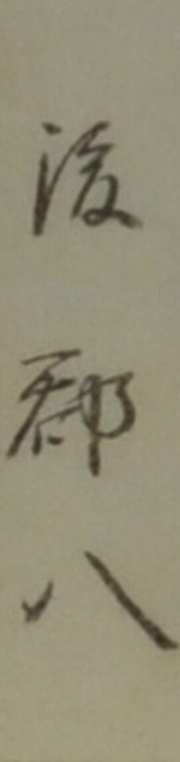後郡八
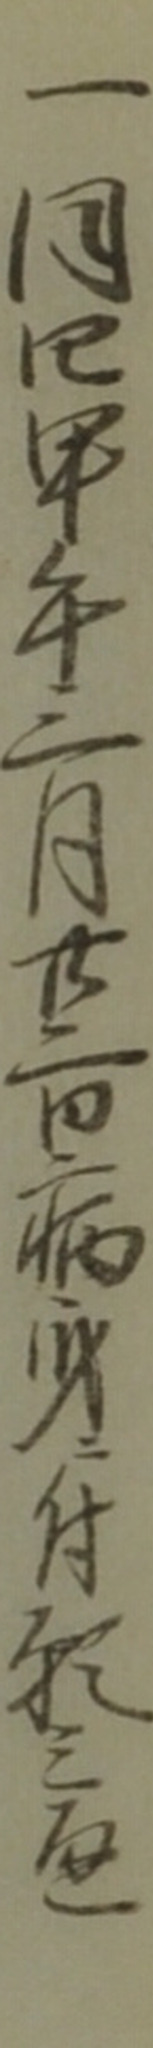一同四甲午三月廿二日病身ニ付願之通
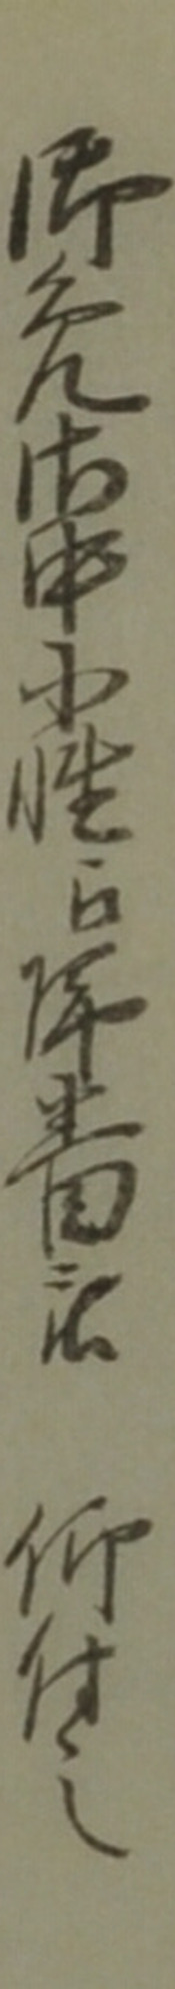御免御中小性江帰番被仰付之
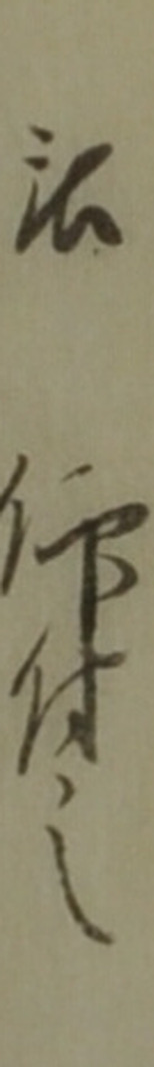被仰付之
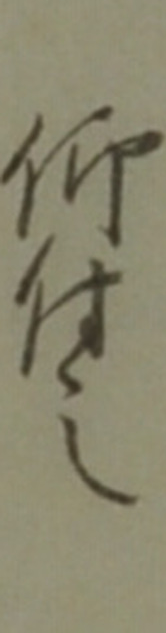仰付之
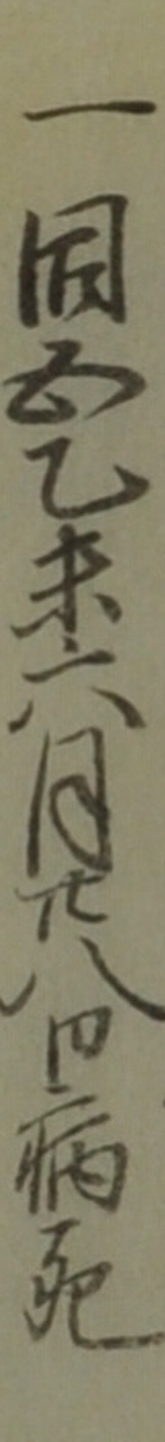一同五乙未六月廿八日病死
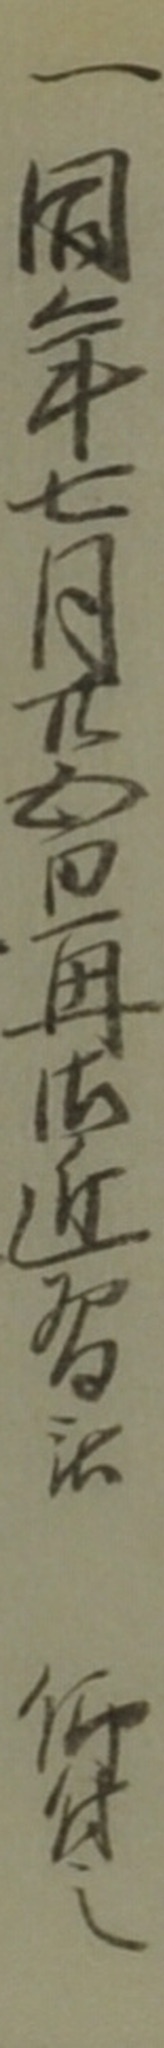一同年七月廿五日再御近習被仰付之
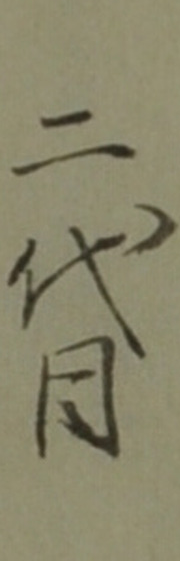二代目
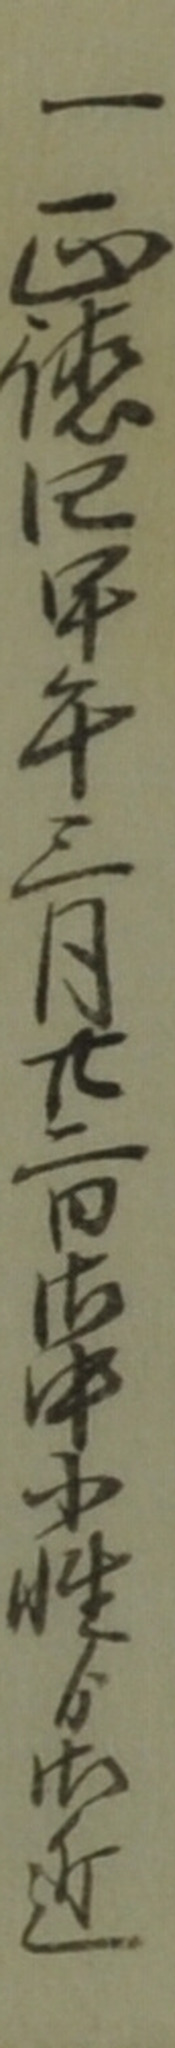一正徳四甲午三月廿二日御中小性ゟ御近
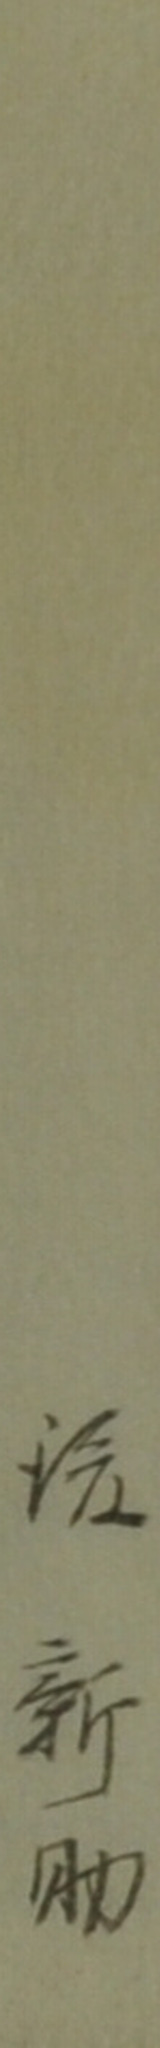後新助
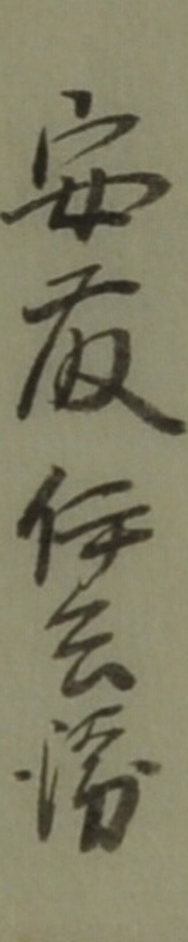安藤伊兵衛
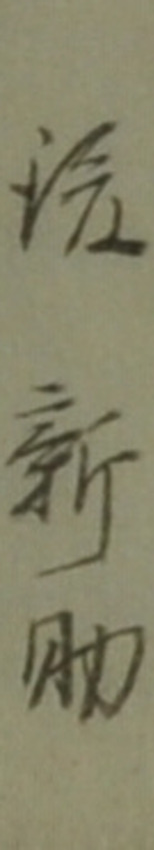後新助
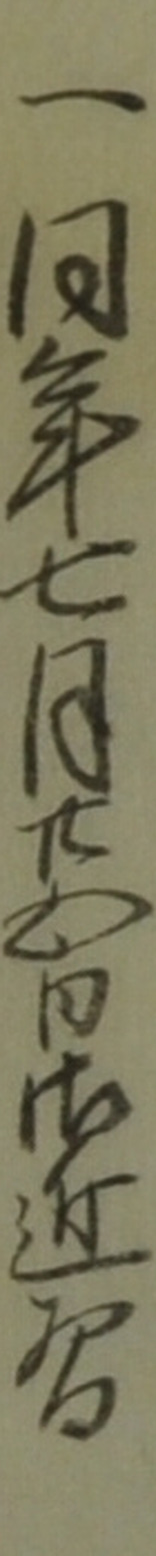一同年七月廿五日御近習
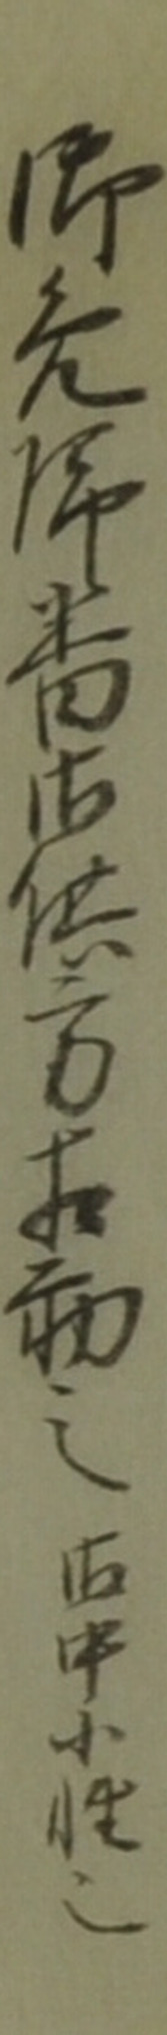御免帰番御供方相勤之御中小性也
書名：諸御役代々録（五）
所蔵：伊那市立高遠町図書館・合同会社AMANE
